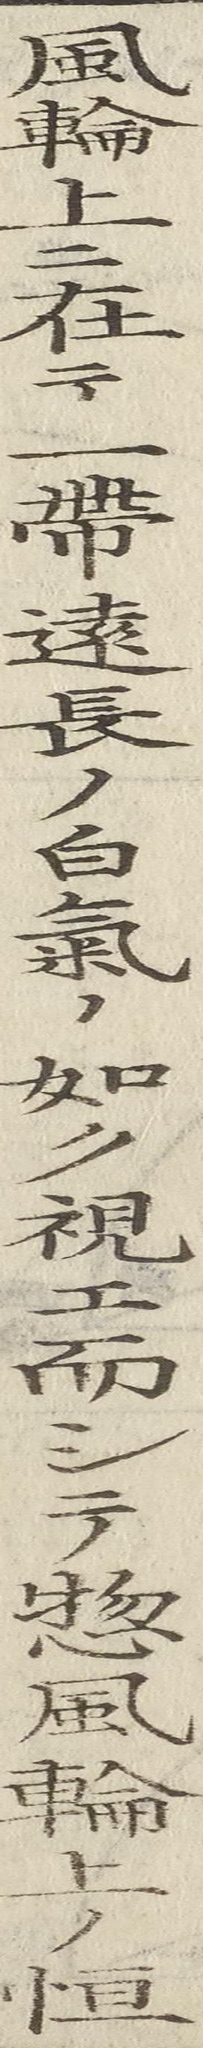風輪上ニ在テ一帯遠長ノ白気ノ如ク視エ而シテ惣風輪上ノ恒
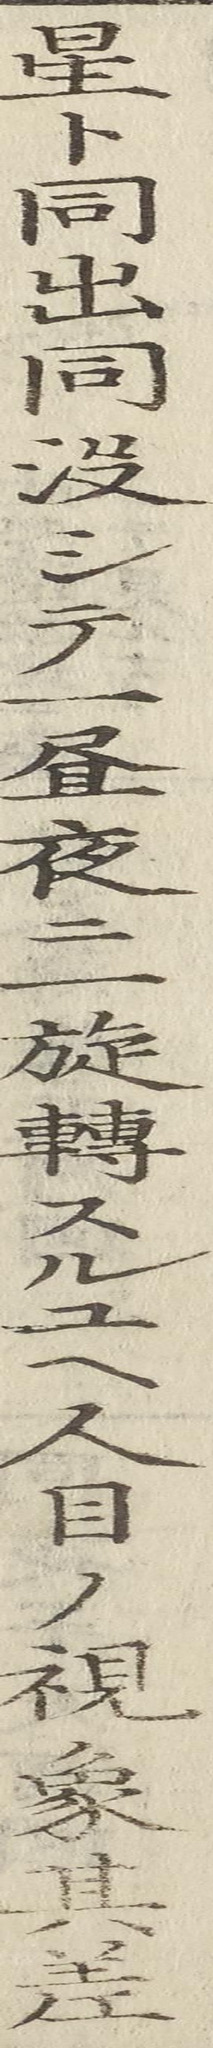星ト同出同没シテ一昼夜ニ一旋転スルユヘ人目ノ視象其差

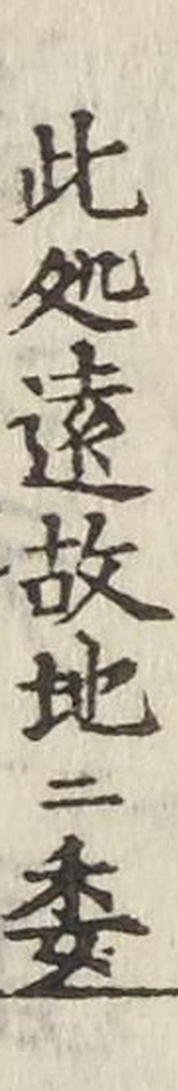壬此処遠故地ニ委
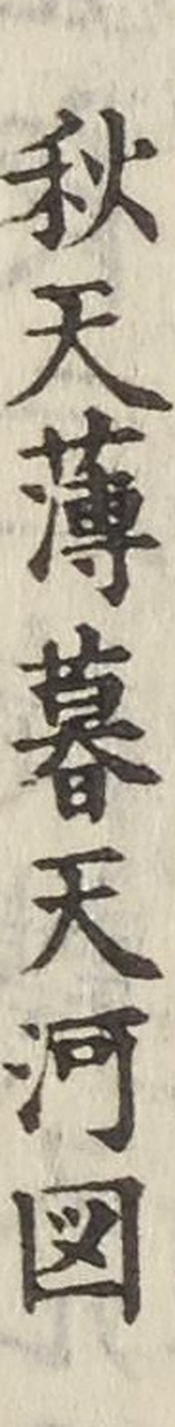秋天薄暮天河図
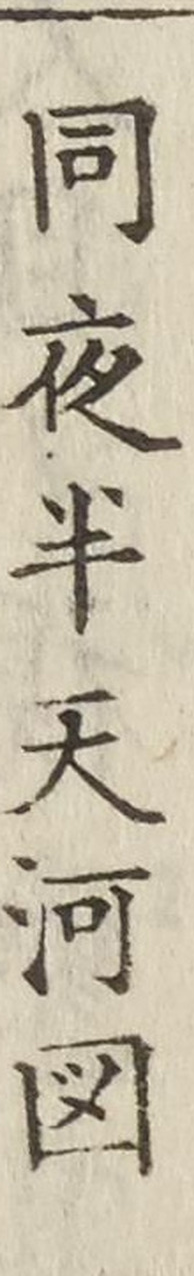同夜半天河図
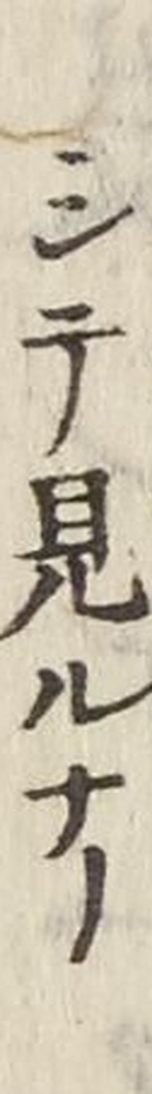シテ見ルナリ
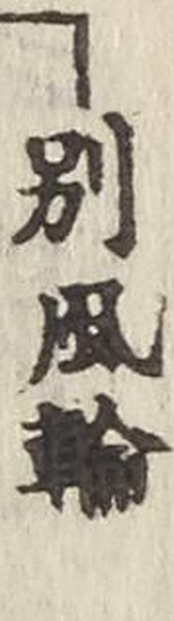別風輪
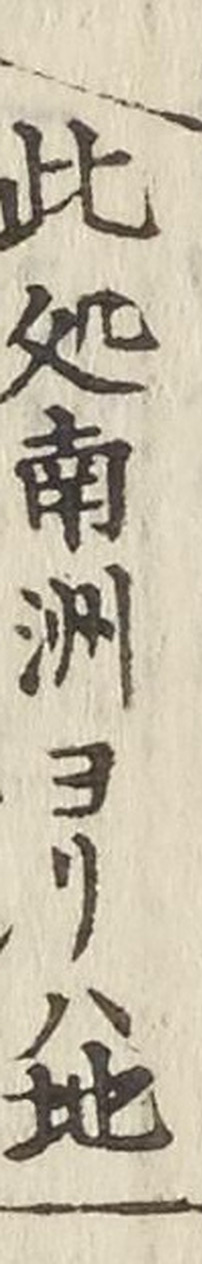此処南洲ヨリハ地
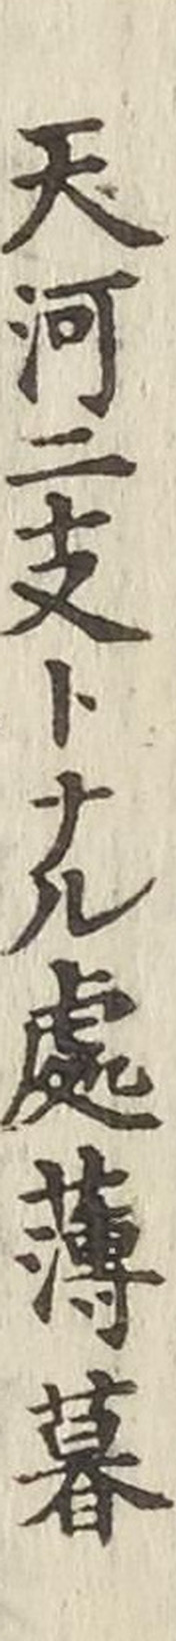天河ニ支トナル処薄暮
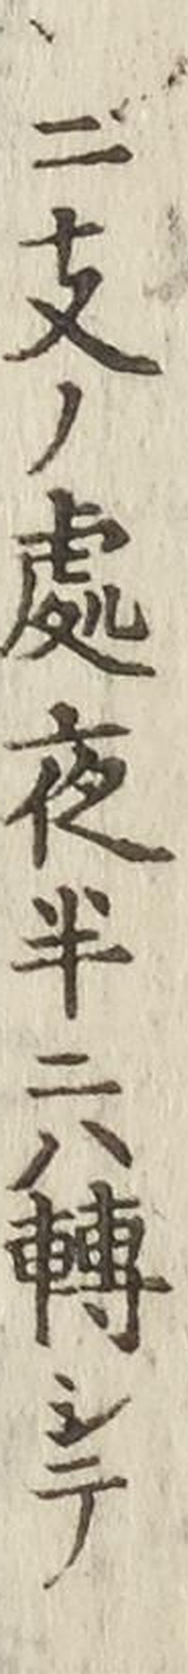ニ支ノ処夜半ニハ転シテ
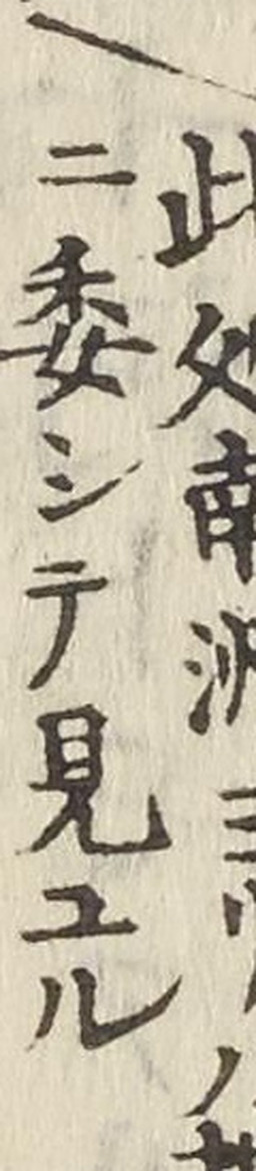ニ委シテ見ユル
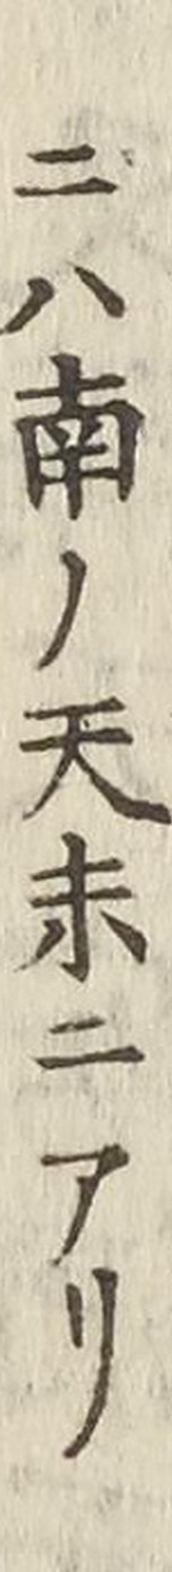ニハ南ノ天末ニアリ
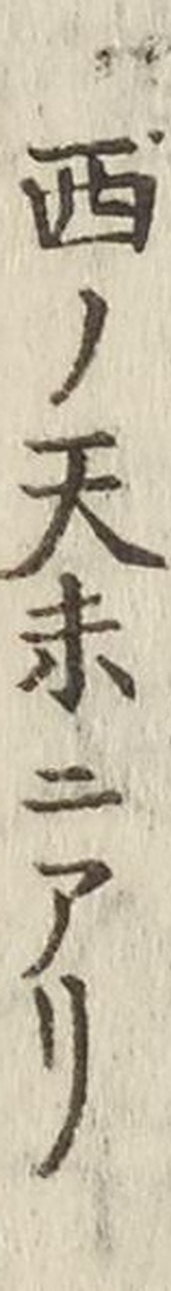西ノ天末ニアリ
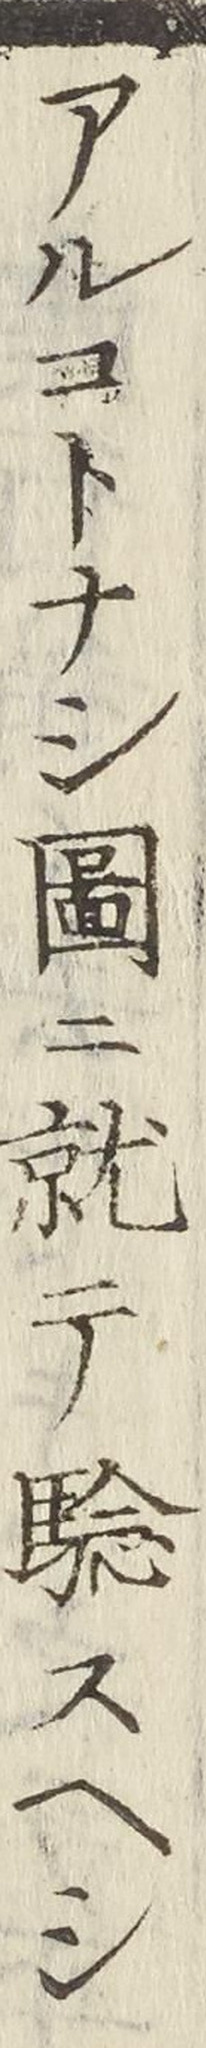アルコトナシ図ニ就テ騐スヘシ
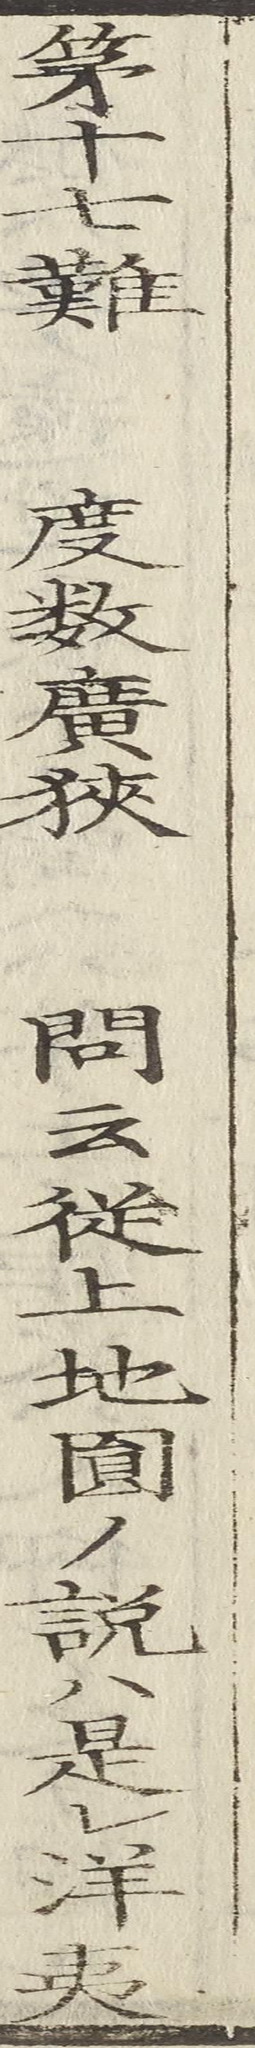第十七難度数広狭問云従上地円ノ説ハ是レ洋夷
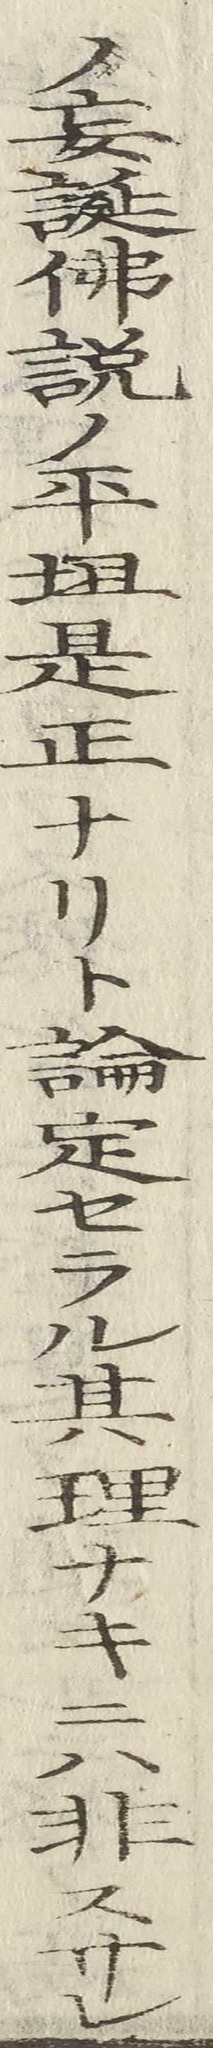ノ妄誕仏説ノ平坦是正ナリト論定セラル其理ナキニハ非スサレ
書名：護法新論　二編　中
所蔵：東京大学地震研究所図書室 Earthquake Research Institute Library, The University of Tokyo, JAPAN
